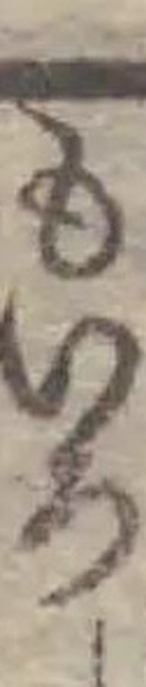もいろ
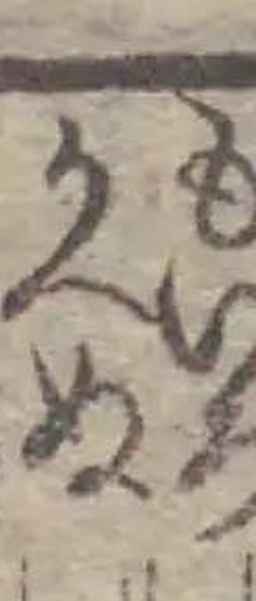かへぬ
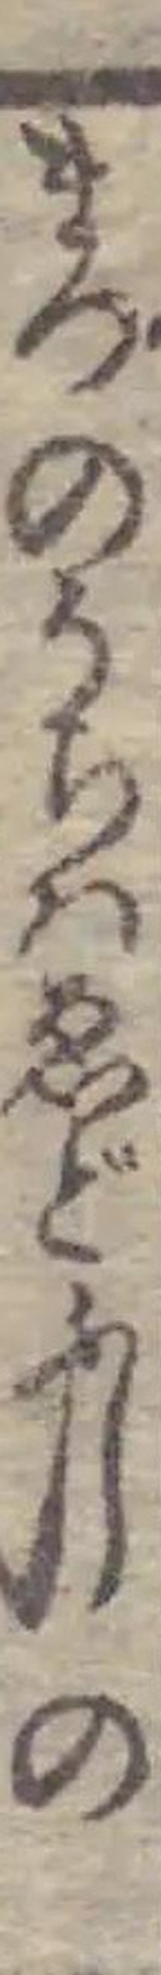まつのうちはゑどふしの
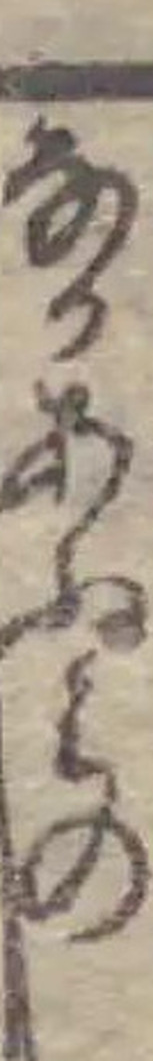なかあふみの
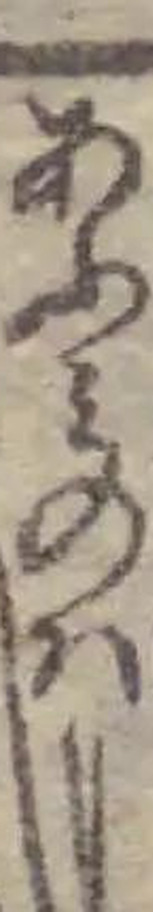あふみのは
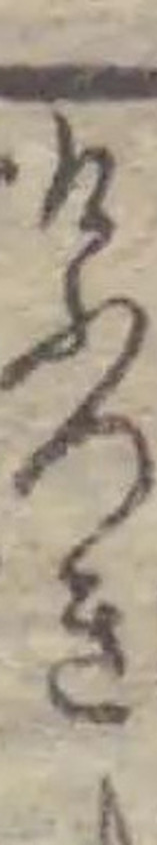けふつき
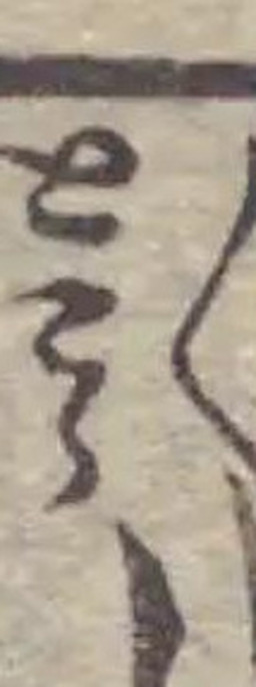とこゝ
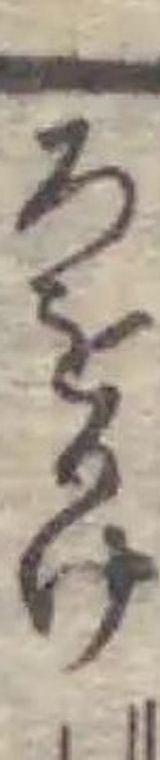ろをかけ
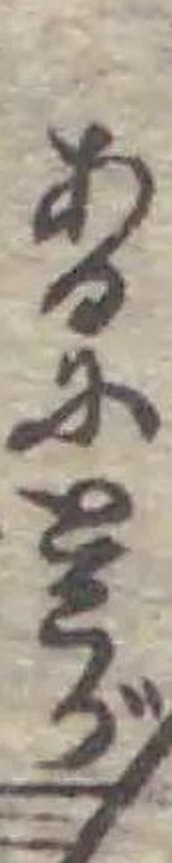あるにとこが
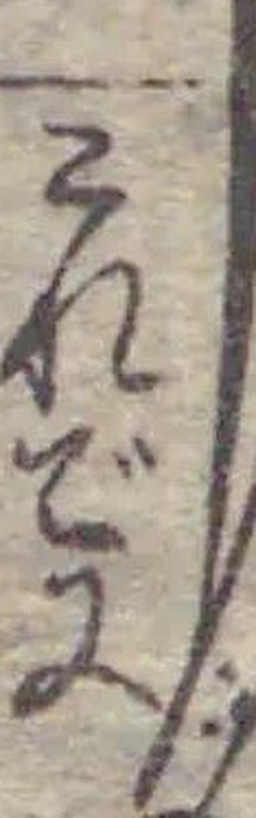これで又
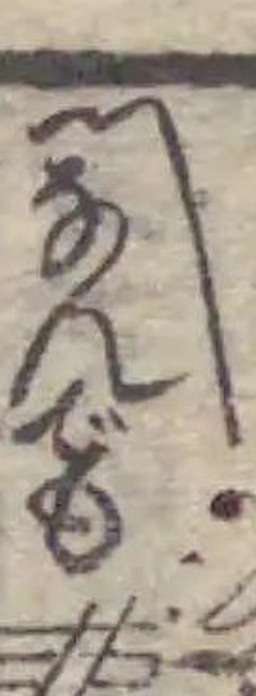〽なんでも
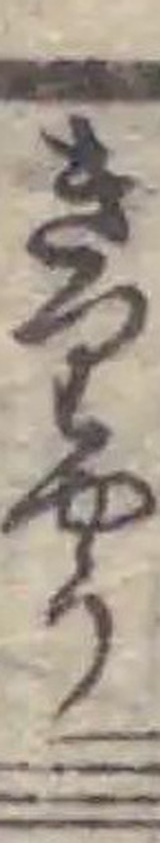きりやう
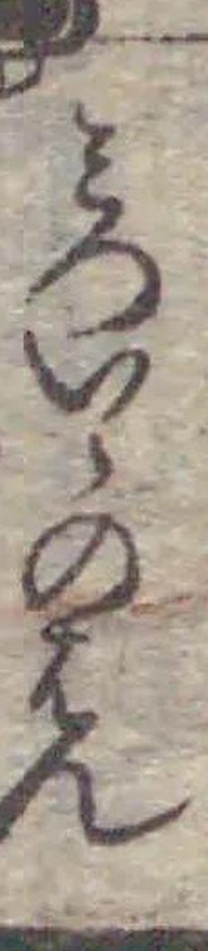みついゝのはん
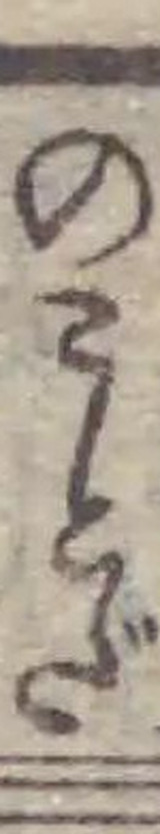のことだ
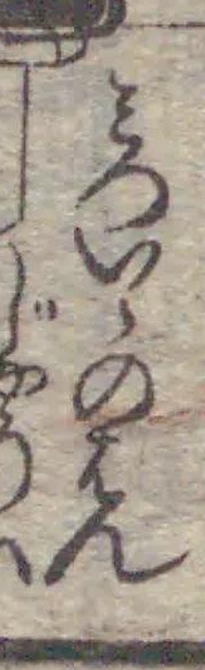みついゝのはん
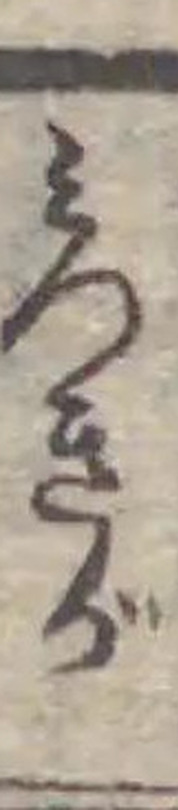みつきが
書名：かんなんの夢枕 2巻
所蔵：国立国会図書館 National Diet Library, JAPAN
